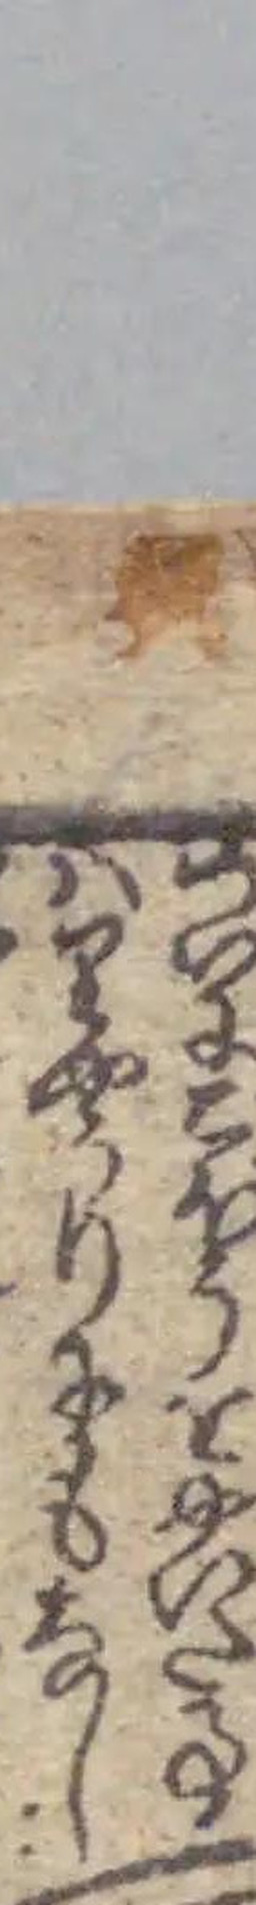はりやうりにもなし
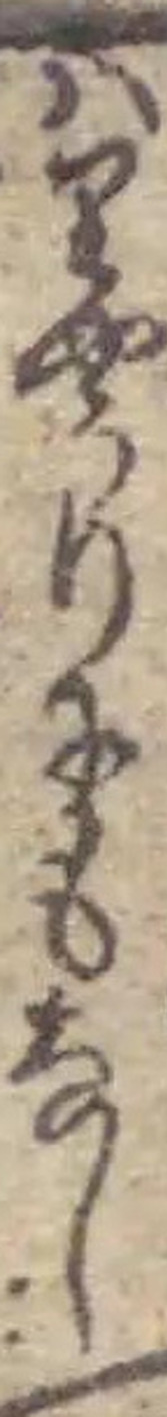はりやうりにもなし
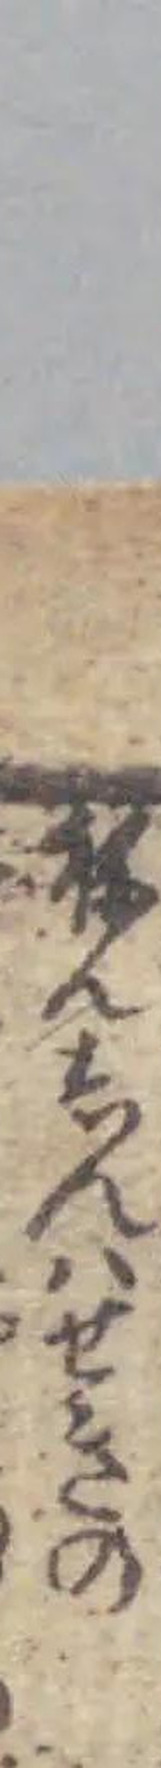ねんしんはせきの
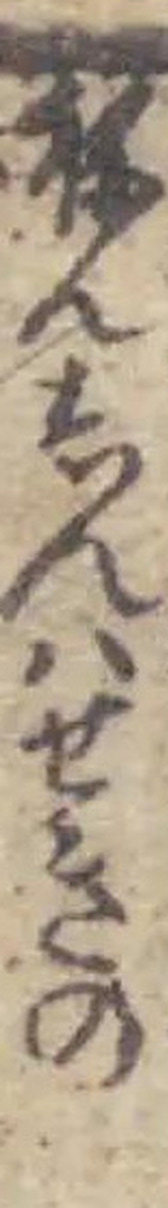ねんしんはせきの
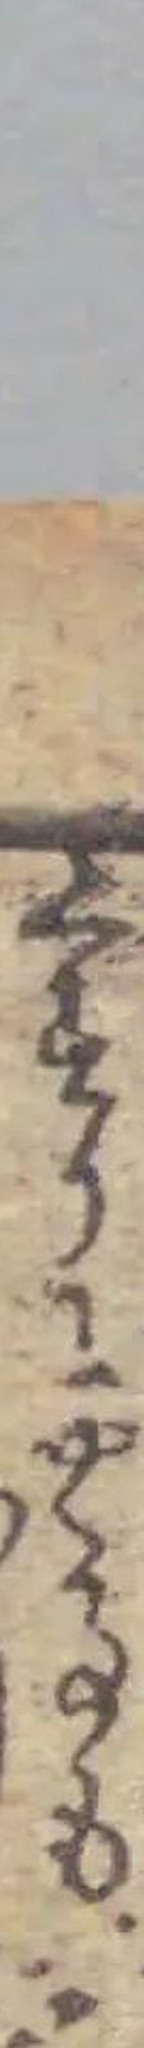くすりにやく事も
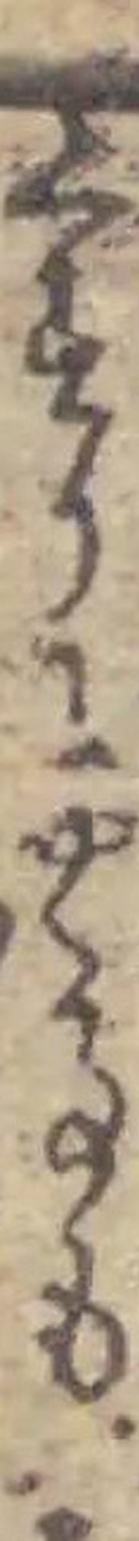くすりにやく事も

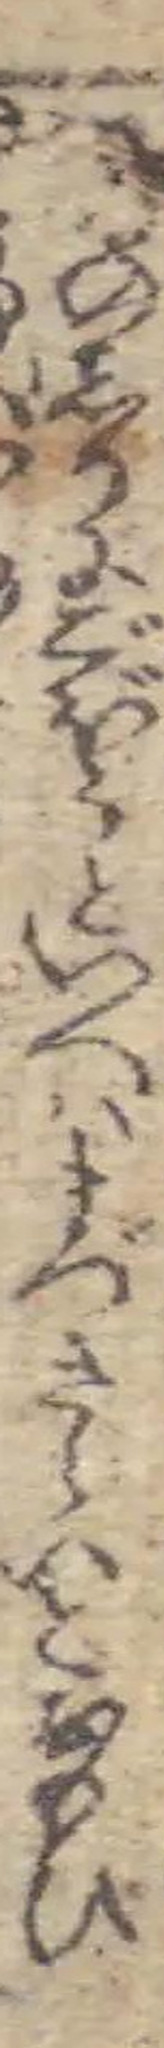さるのしりにごぼうといへはまづきらいとおもひ
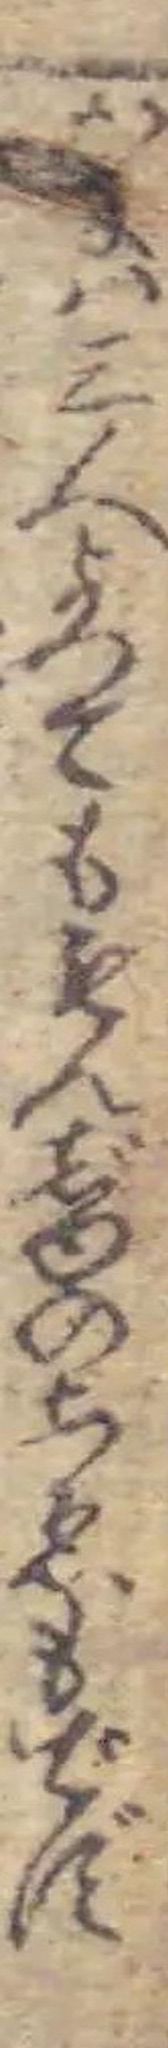かには三人よつてももんぢゆのちゑもでず
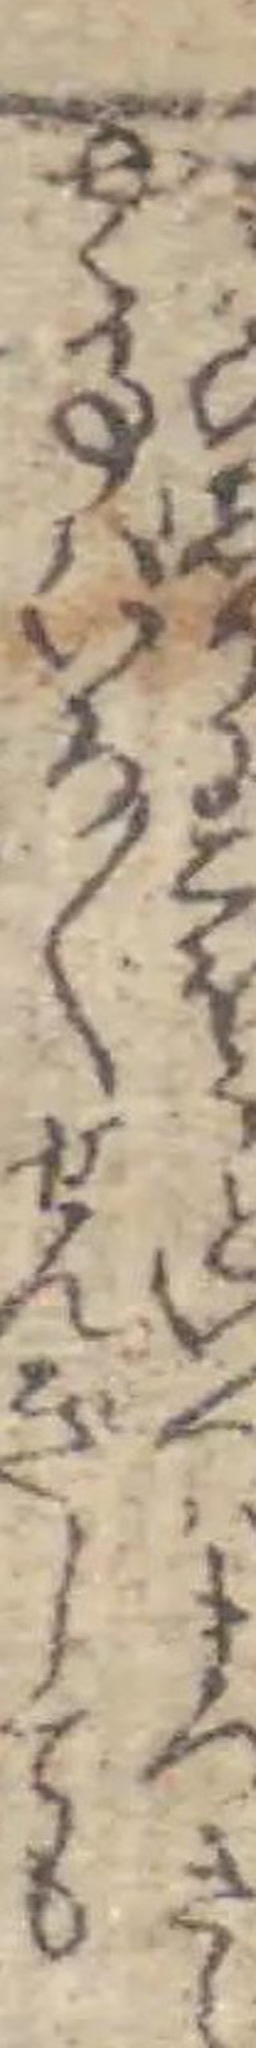やく事はいろ〳〵せんぎしても
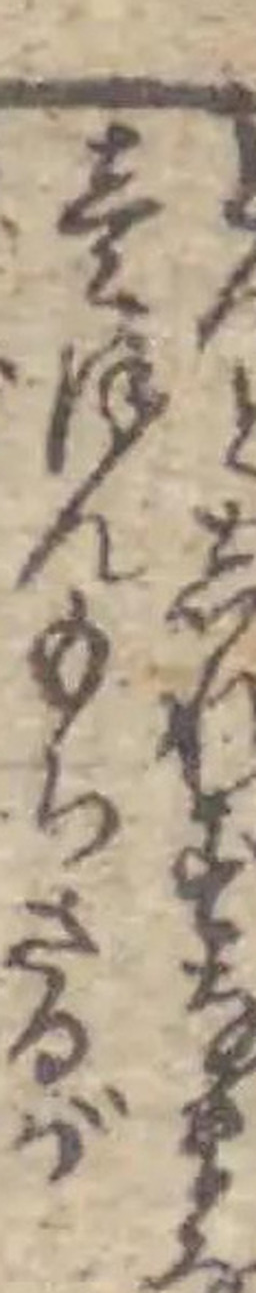壱ほんもちさるが
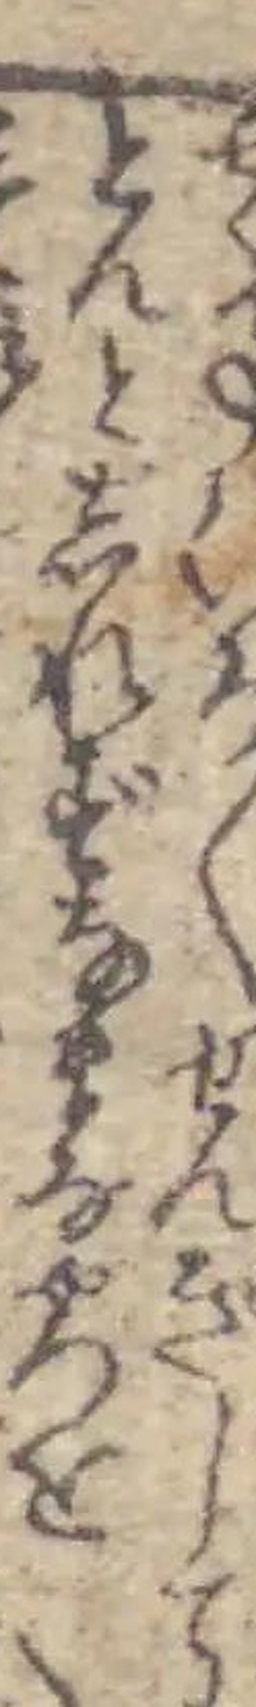とんとしれずなまなやつを
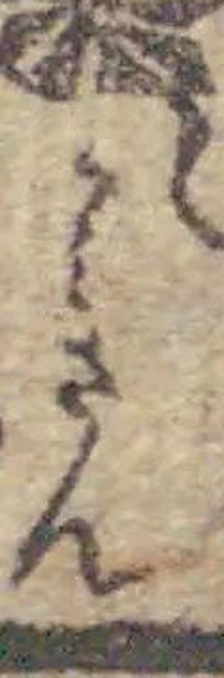かみさん
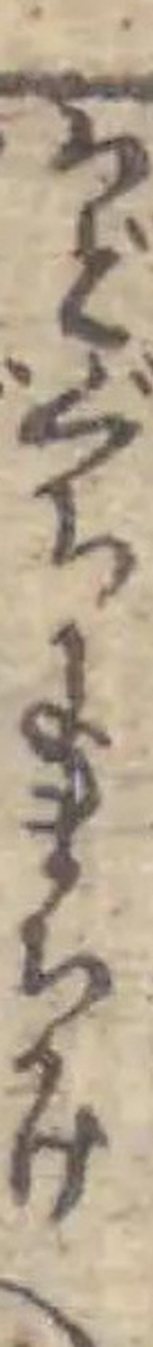かどぐちにまちかけ
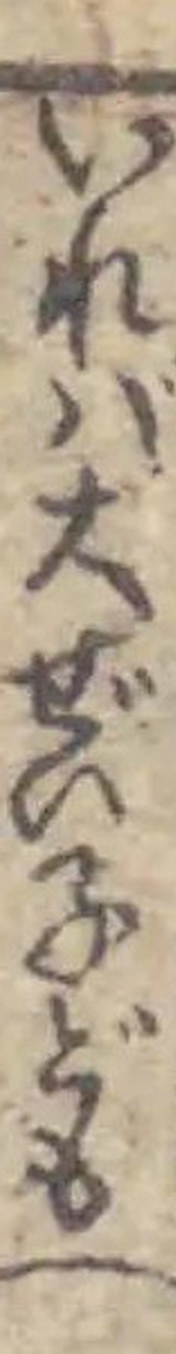いれば大ぜい子ども
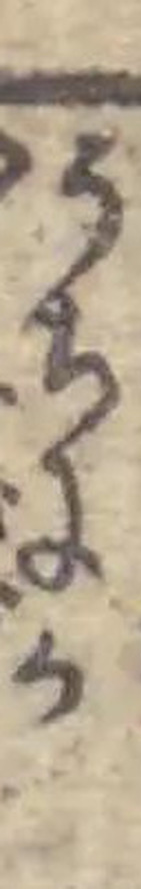うちにか
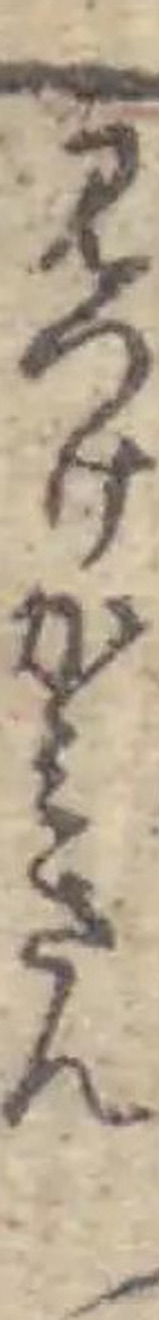見つけかみさん
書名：蟹牛房挟多 3巻
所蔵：国立国会図書館 National Diet Library, JAPAN
